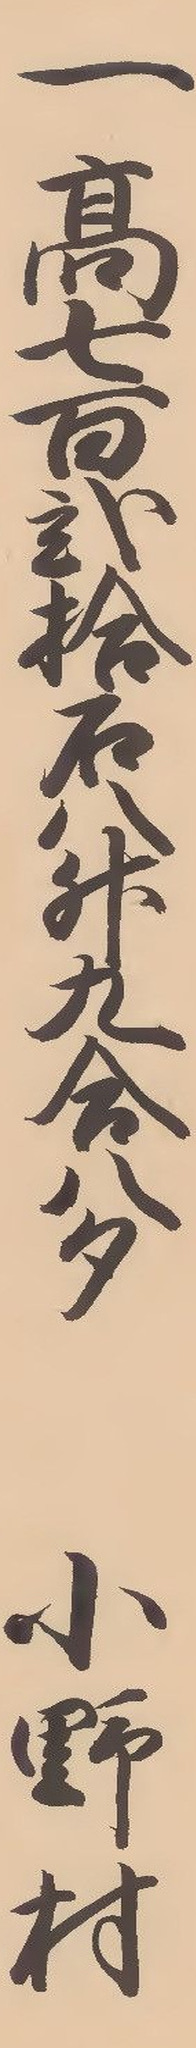一高七百弐拾石八升九合八勺小野村
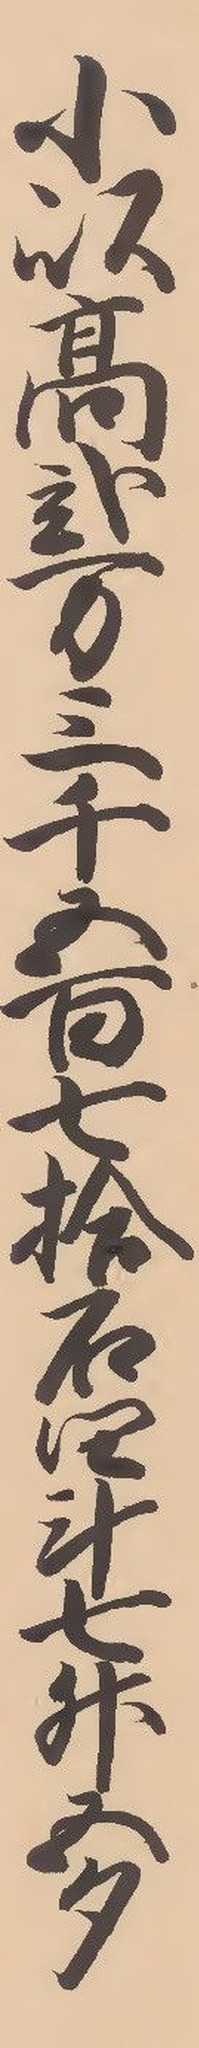小以高弐万三千五百七拾石四斗七升五勺
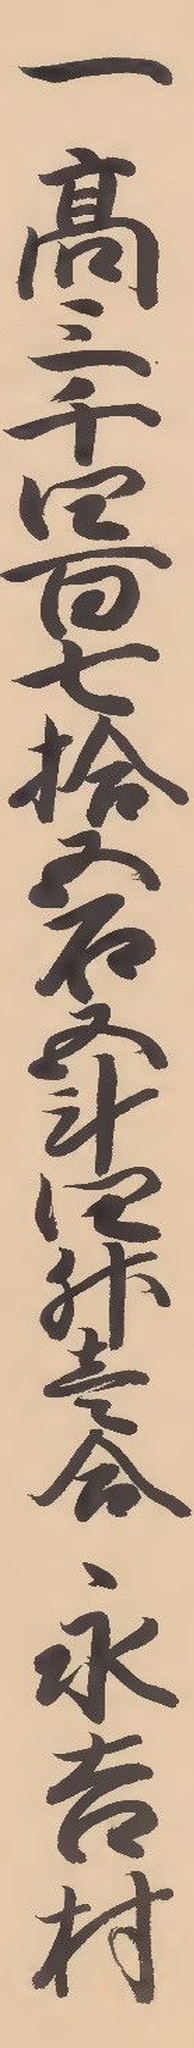一高三千四百七拾五石五斗四升壱合永吉村
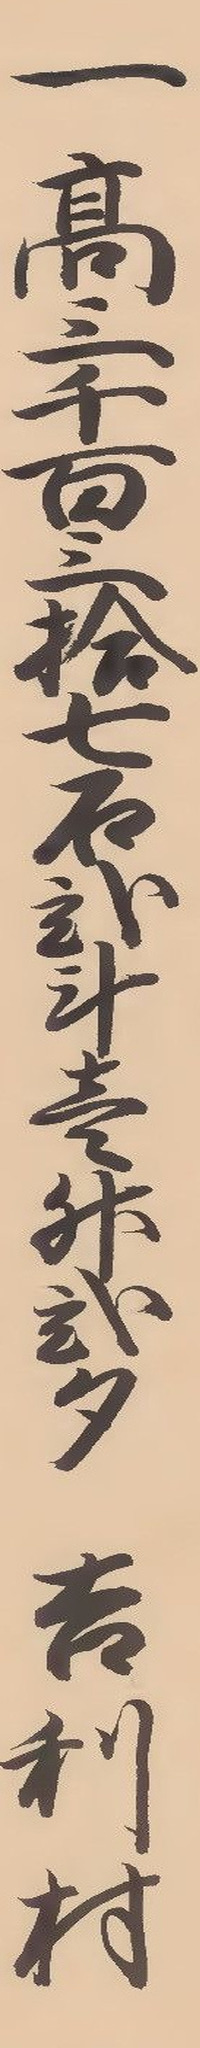一高三千百三拾七石弐斗壱升弐勺吉利村
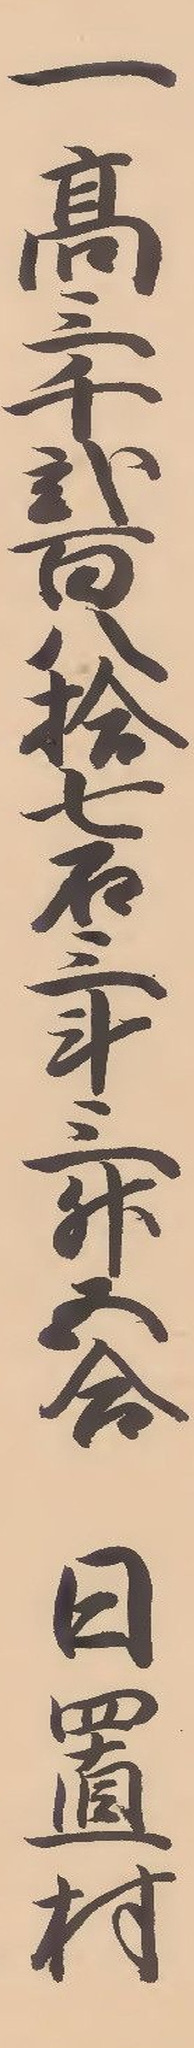一高三千弐百八拾七石三斗三升五合日置村

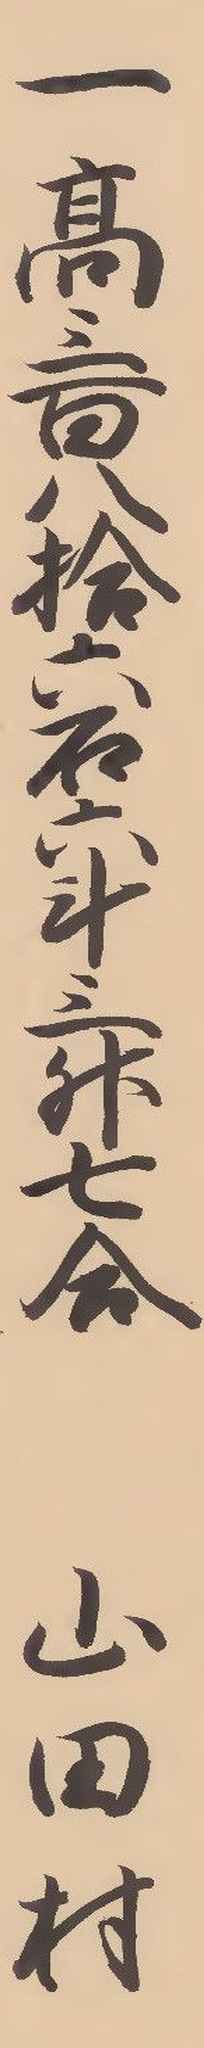一高三百八拾六石六斗三升七合山田村
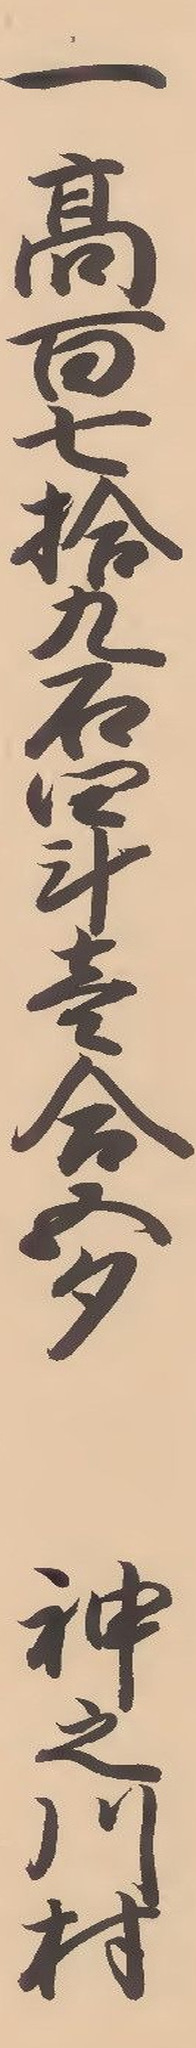一高百七拾九石四斗壱合五勺神之川村
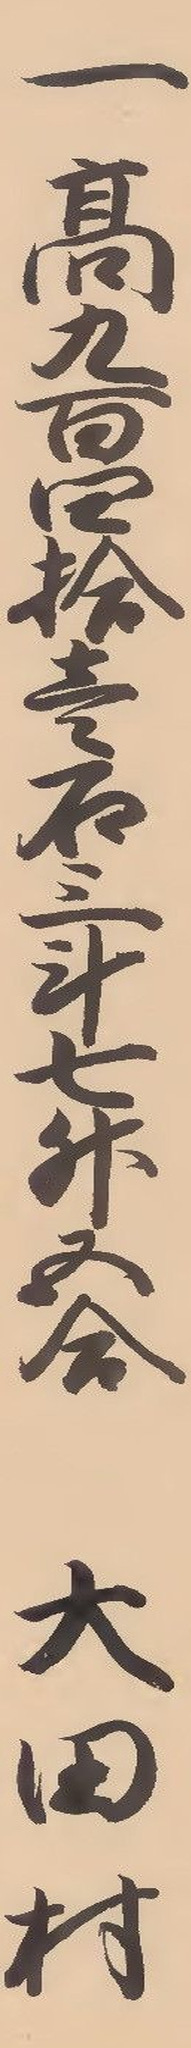一高九百四拾壱石三斗七升五合大田村
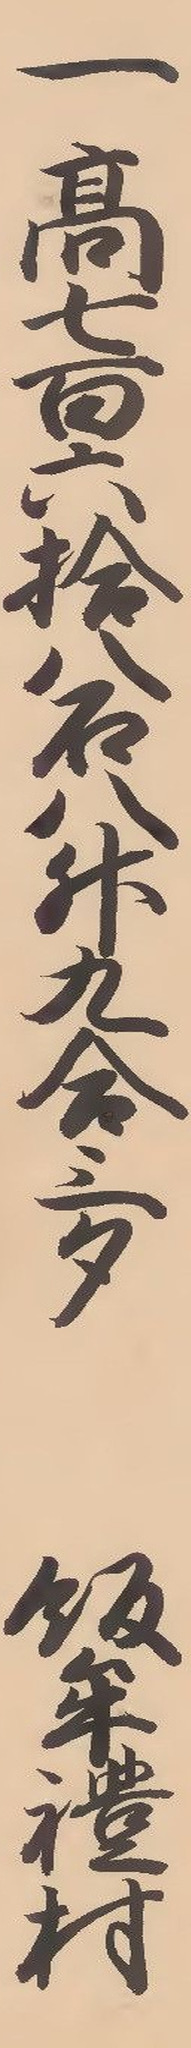一高七百六拾八石八升九合三勺飯牟礼村
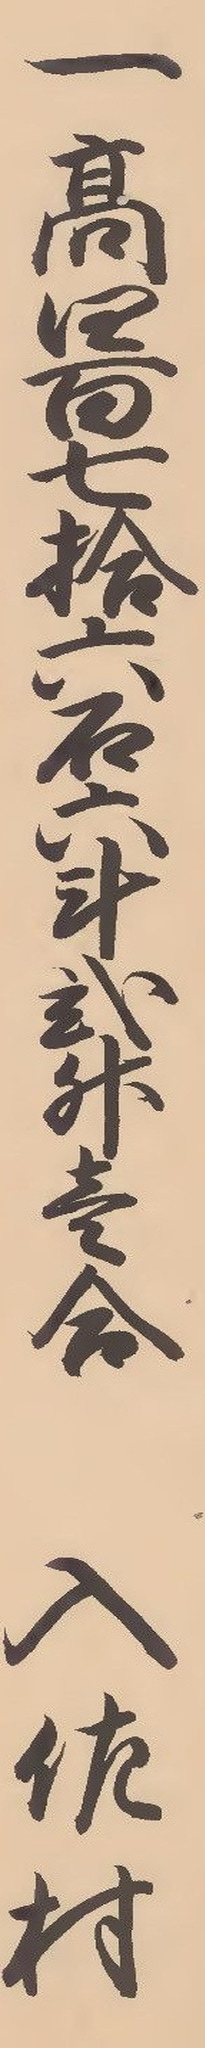一高四百七拾六石六斗弐升壱合入佐村
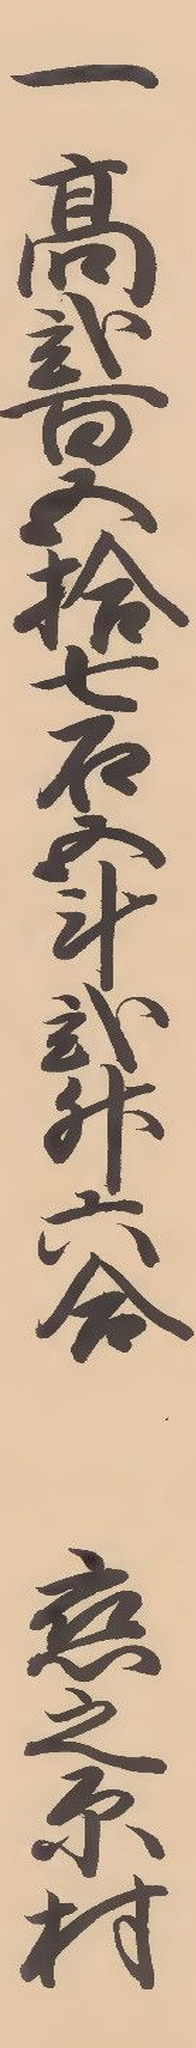一高弐百五拾七石五斗弐升六合恋之原村
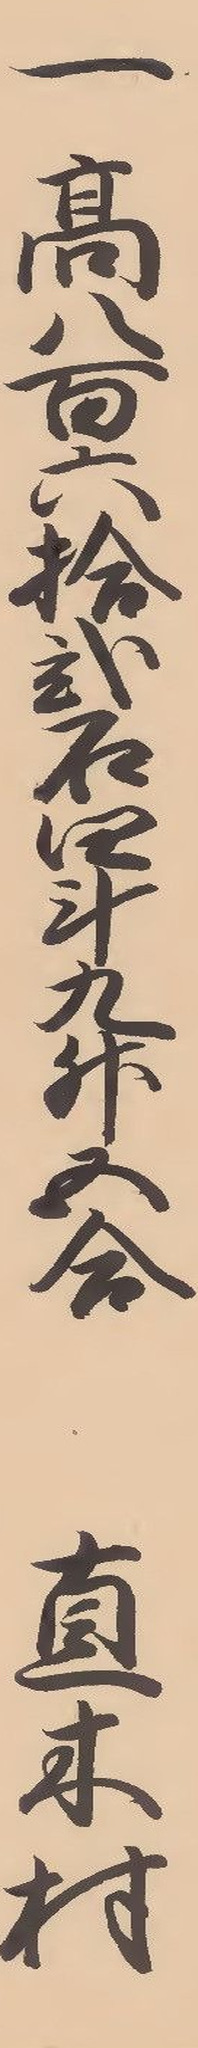一高八百六拾弐石四斗九升五合直木村
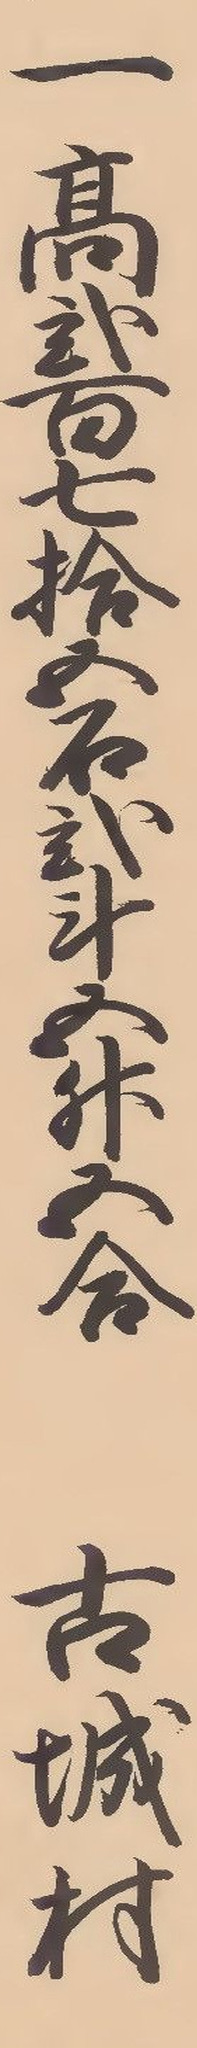一高弐百七拾五石弐斗五升五合古城村

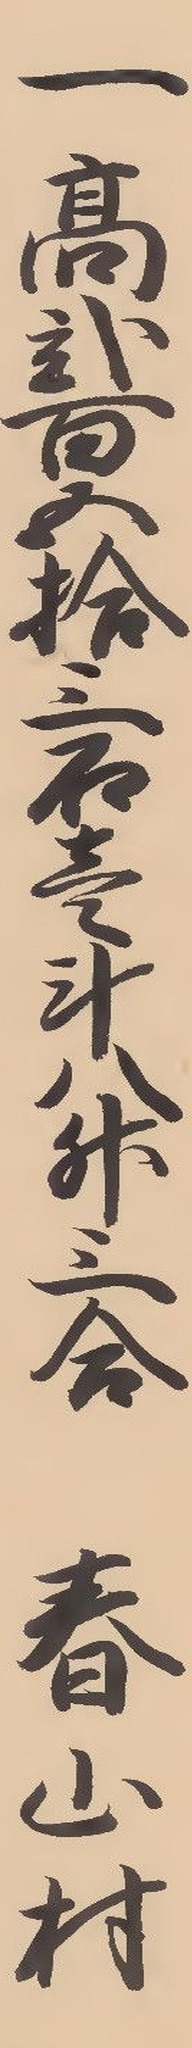一高弐百五拾三石壱斗八升三合春山村
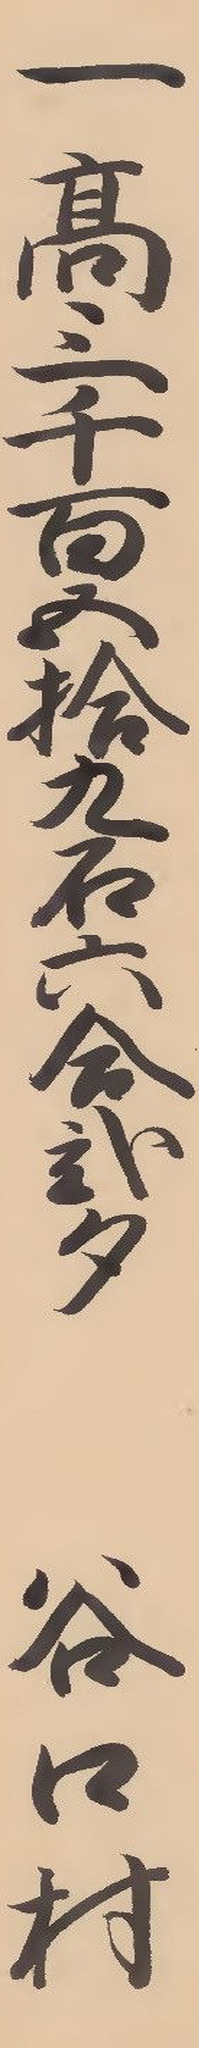一高三千百五拾九石六合弐勺谷口村
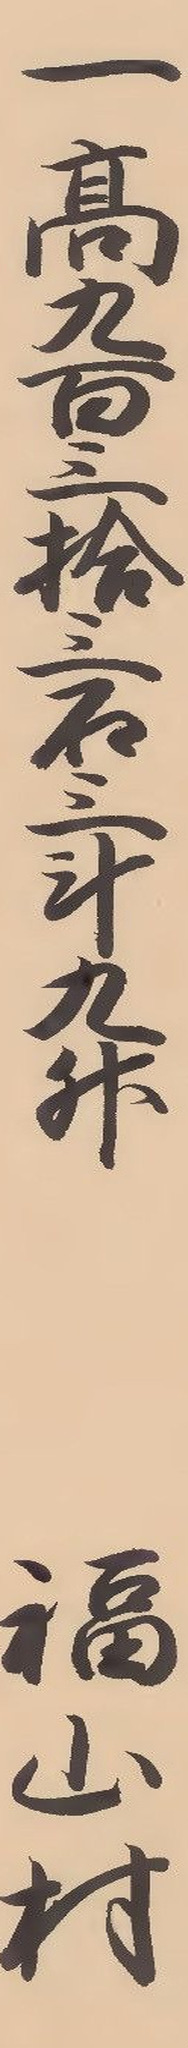一高九百三拾三石三斗九升福山村
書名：薩摩国郷帳
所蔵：国立公文書館 National Archives of Japan
